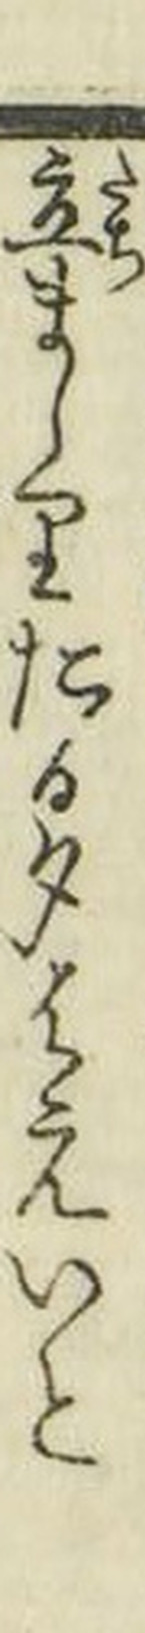立ましりたる夕はえいと
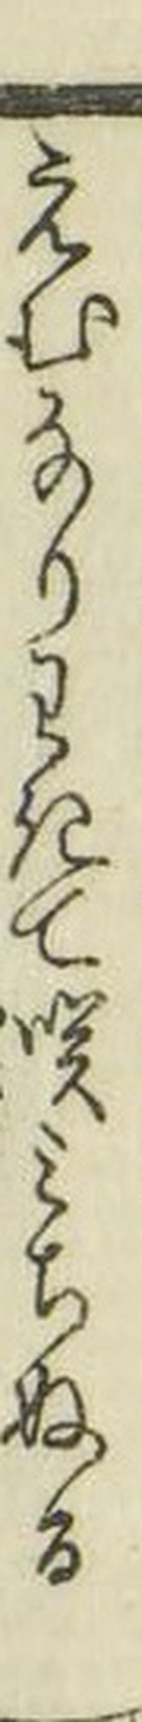えむなりわきて咲みちぬる
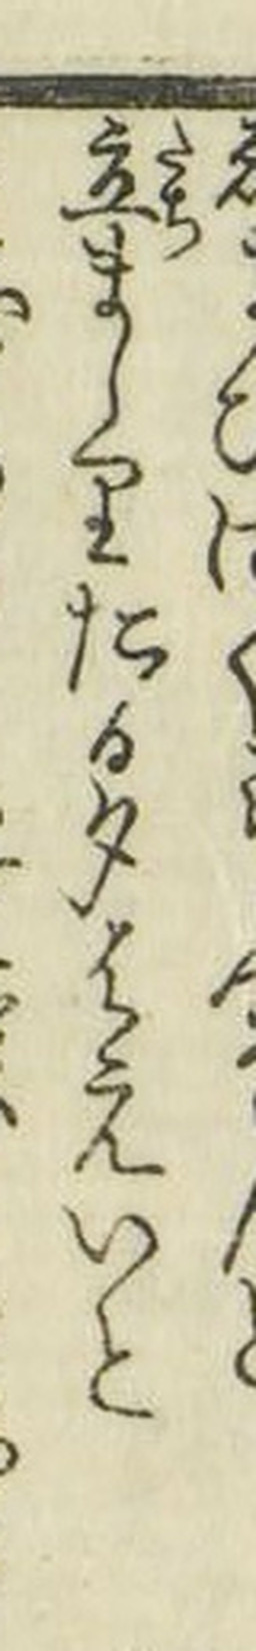立ましりたる夕はえいと
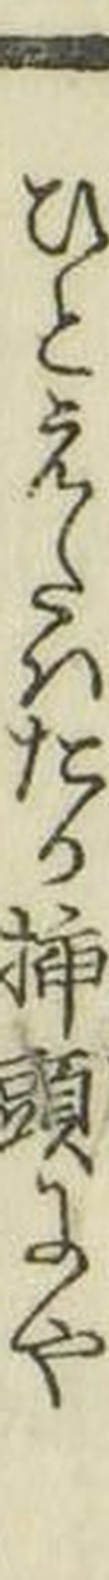ひとえたはたか挿頭にや
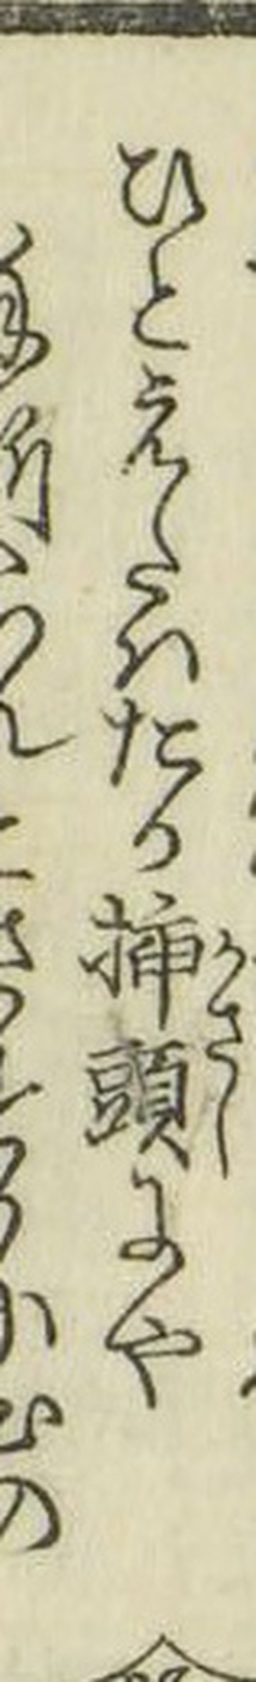手折らんとさすかに心の
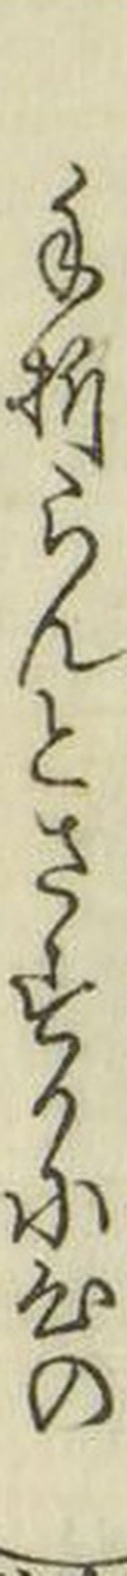手折らんとさすかに心の
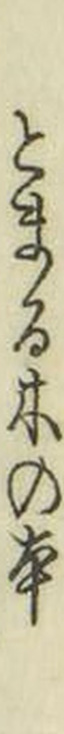とまる木の本
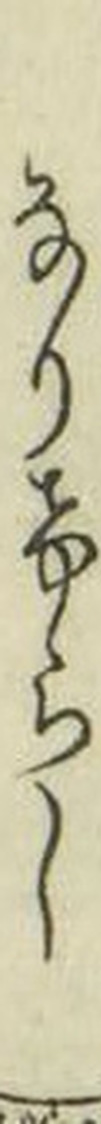なりけらし

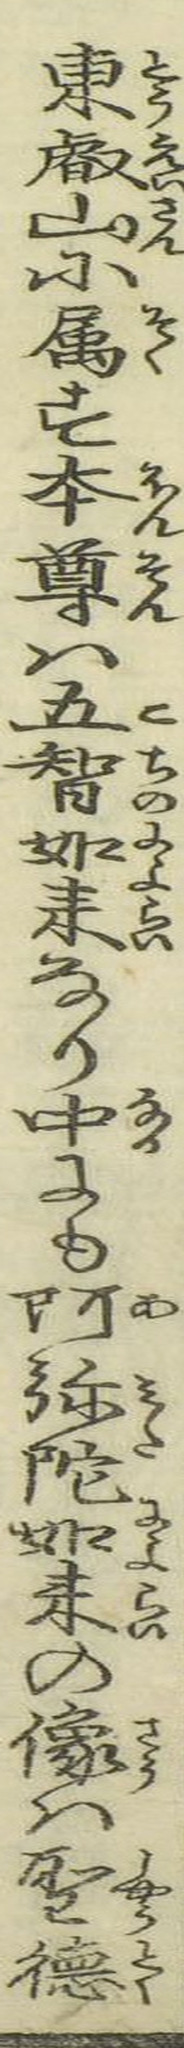東叡山に属す本尊は五智如来なり中にも阿弥陀如来の像は聖徳
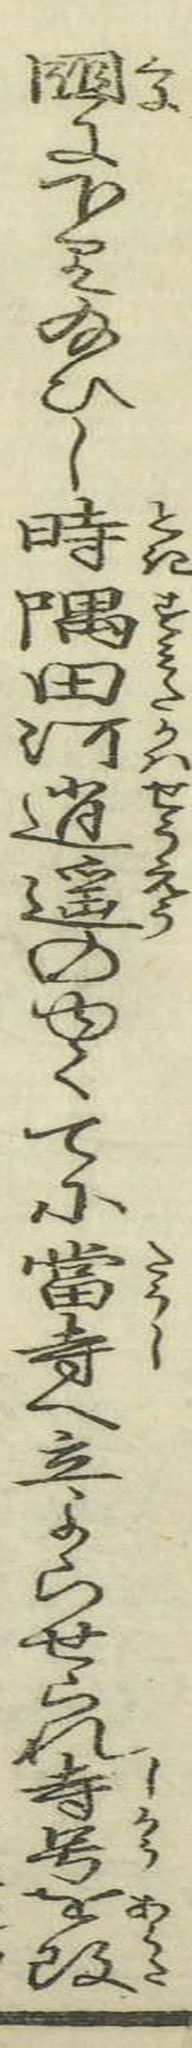国に下り給ひし時隅田河逍遥のゆくてに当寺へ立よらせられ寺号を改
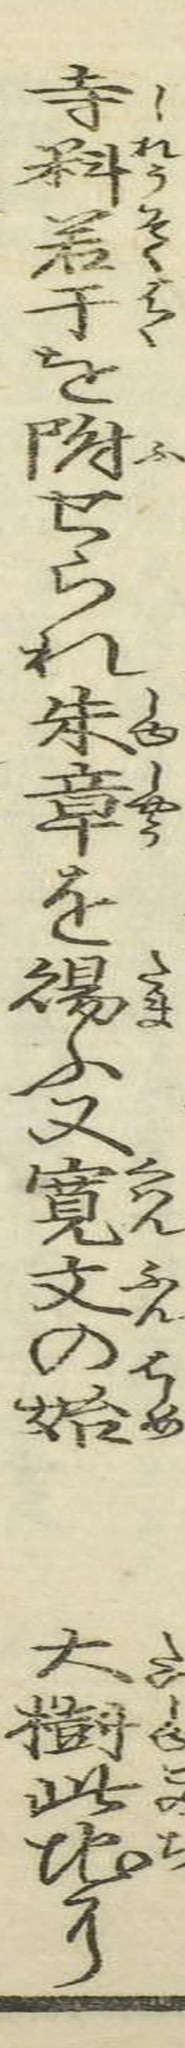寺料若干を付せられ朱章を賜ふ又寛文の始大樹此地に
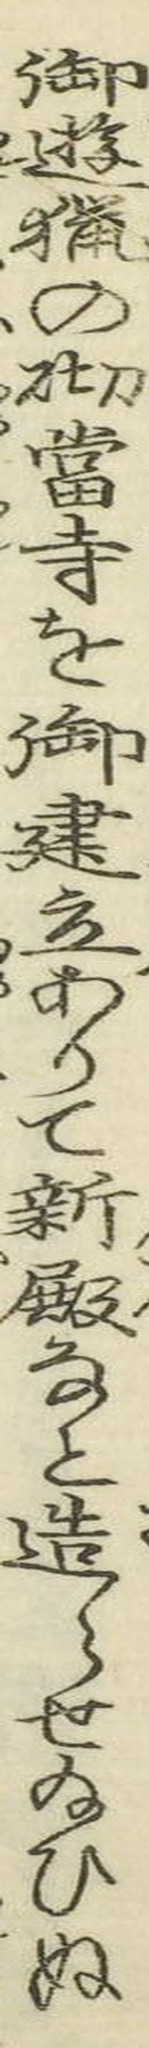御遊猟の拗当寺を御建立ありて新殿なと造らせ給ひぬ
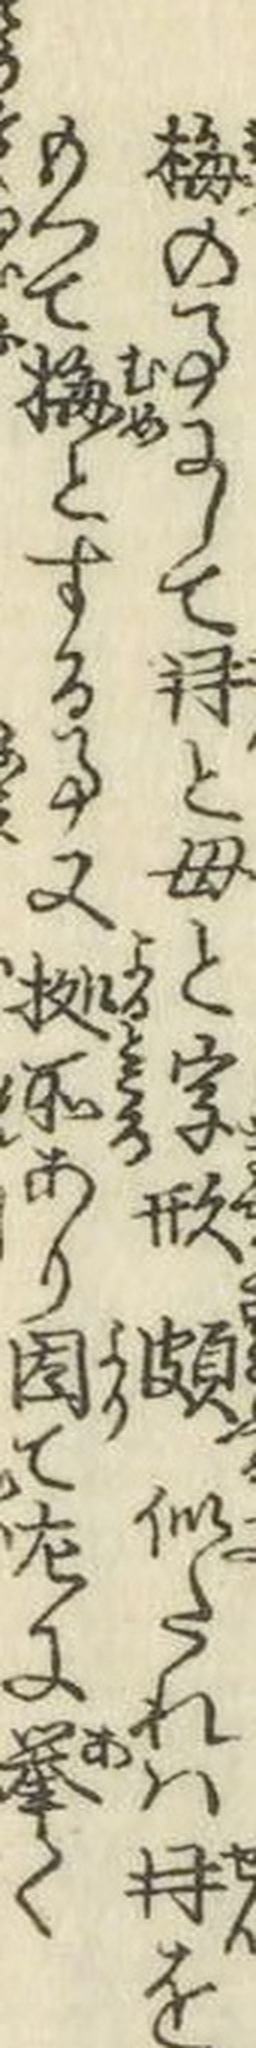もつて梅とする事又拠所あり因て左に挙く
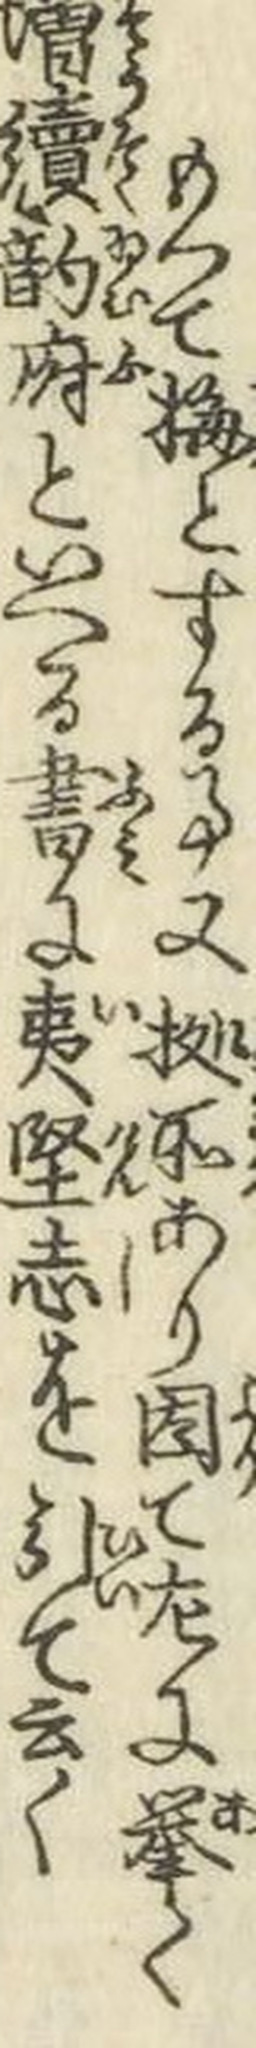増続韻府といへる書に夷堅志を引て云く
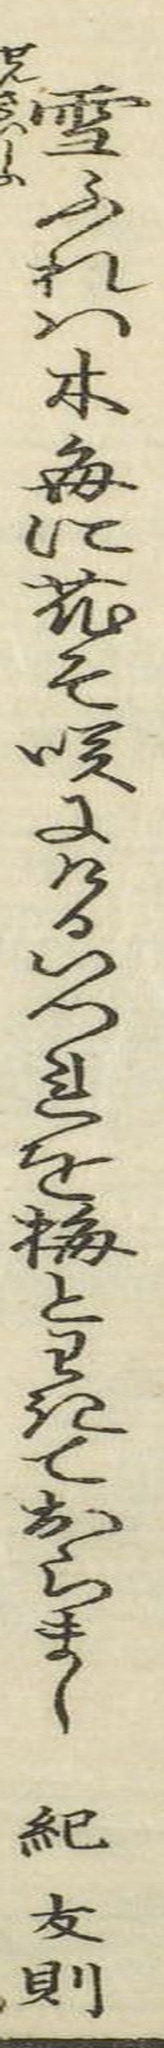雪ふれは木毎に花そ咲にけるいつれを梅とわきておらまし紀友則
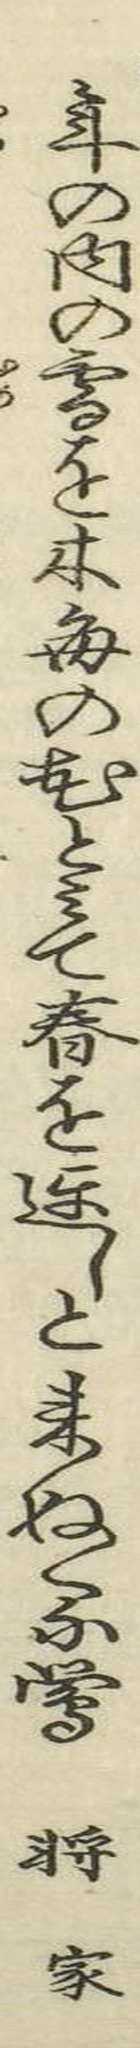年の内の雪を木毎の花とみて春を遅しと来ぬる鴬将家
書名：江戸名所図会 20巻 巻之19
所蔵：東京学芸大学教育コンテンツアーカイブ
